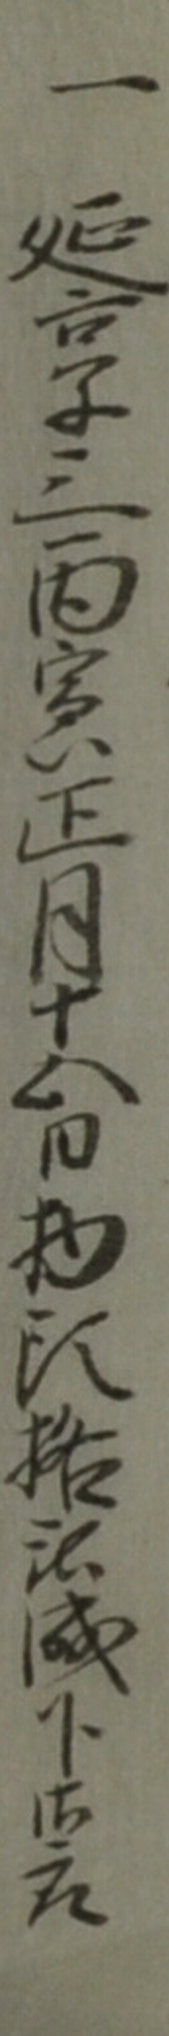一延享三丙寅正月十五日物頭格被成下御取
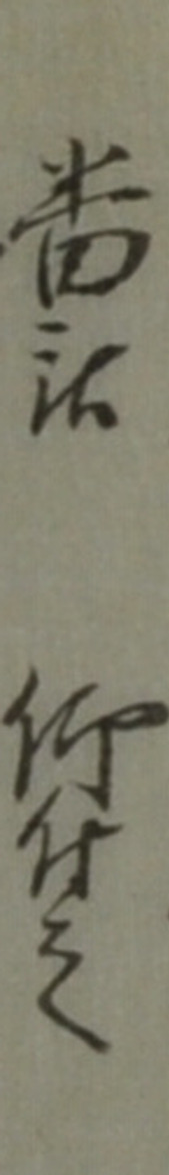番被仰付之
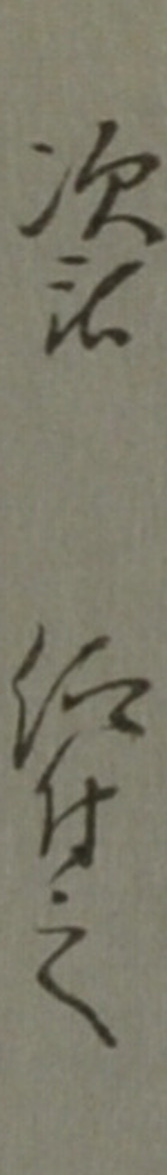次被仰付之
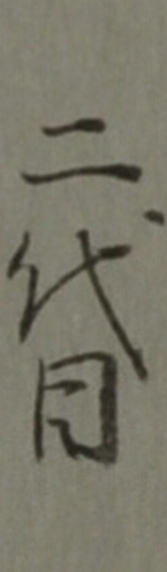二代目
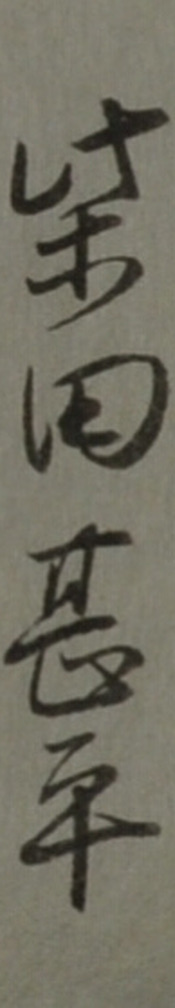柴田甚平
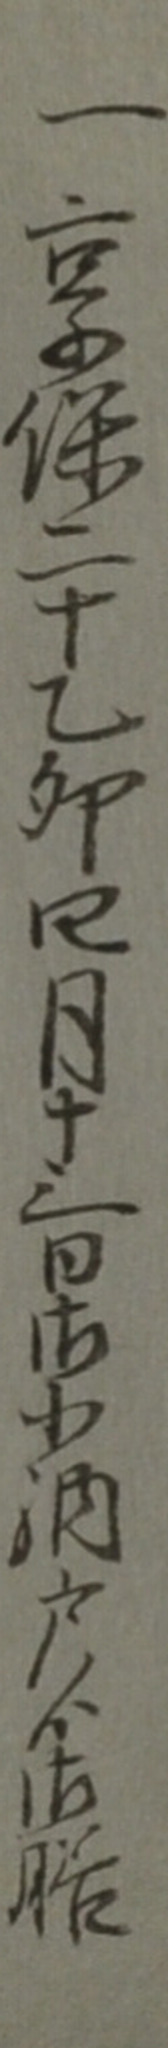一享保二十乙卯四月十三日御小納戸ゟ御膳
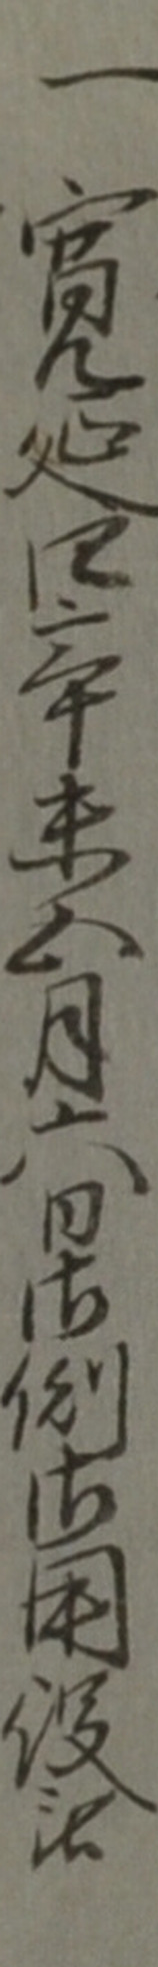一寛延四辛未五月六日御側御用役被
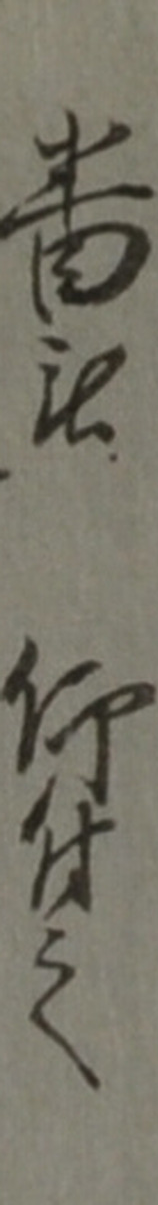番被仰付之
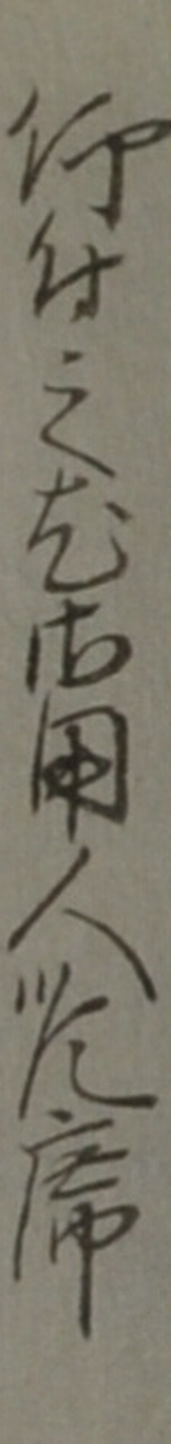仰付之尤御用人順席
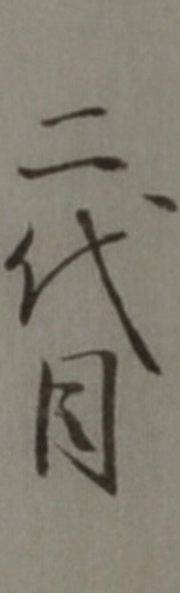二代目
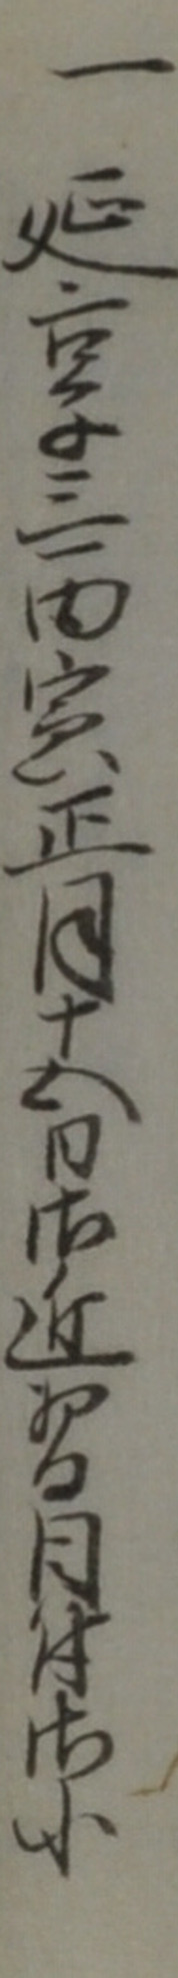一延享三丙寅正月十五日御近習目付御小
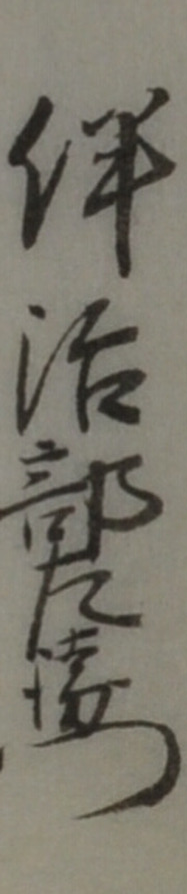伴治部左衛門
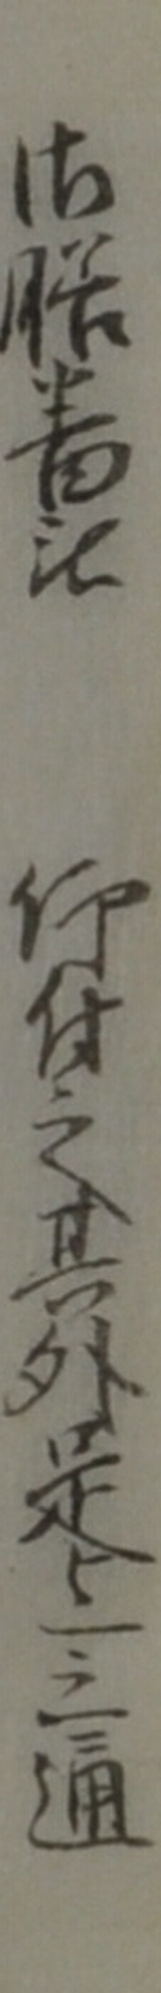御膳番被仰付之其外是迄之通
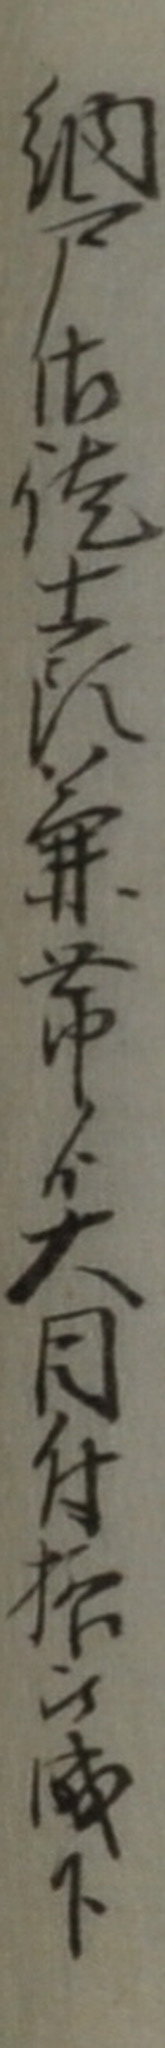納戸御徒士頭兼帯ゟ大目付格被成下
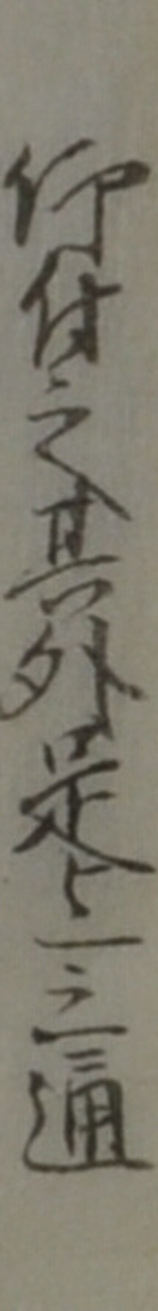仰付之其外是迄之通
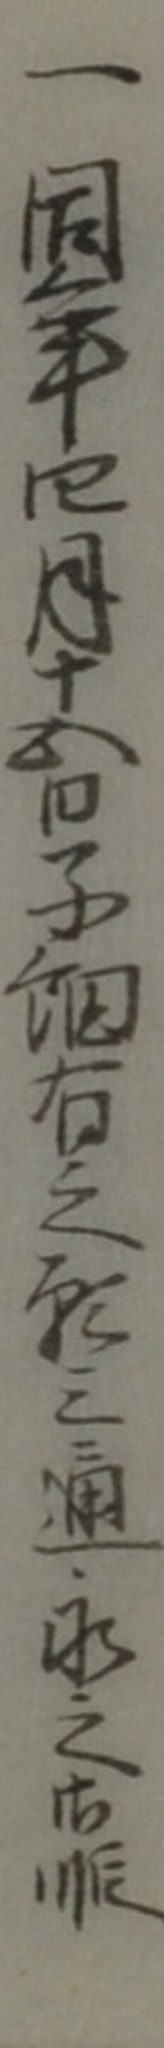一同年四月十五日子細有之願之通永之御暇
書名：諸御役代々録（四）
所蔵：伊那市立高遠町図書館・合同会社AMANE
